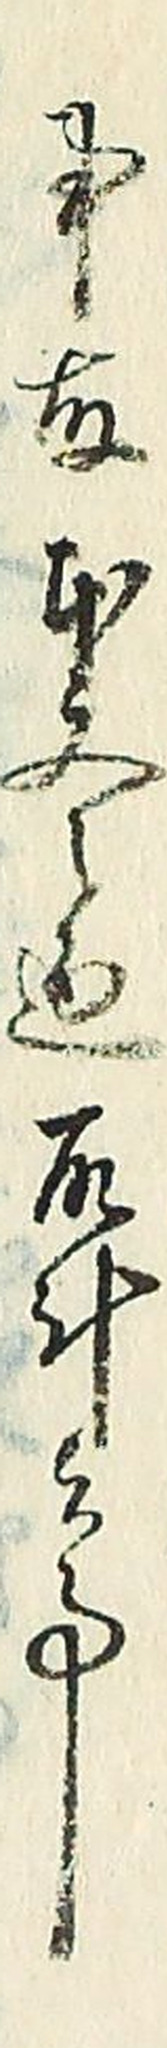事故本文之通取計候事
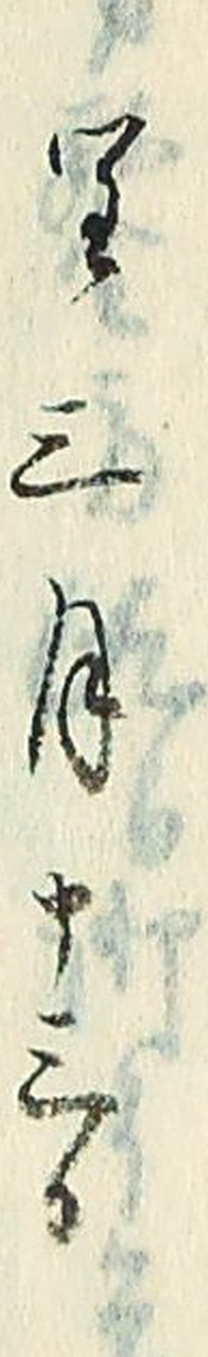閏三月十三日
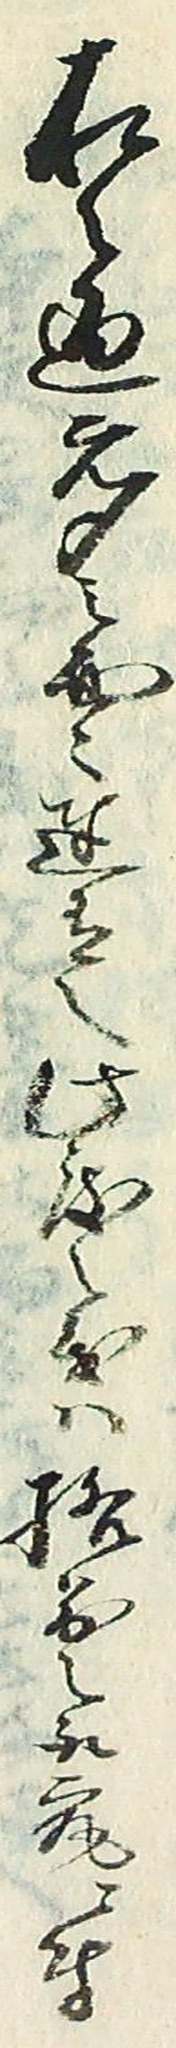右之通元〆之面々達有之此度之義ハ格別之取究ニ付
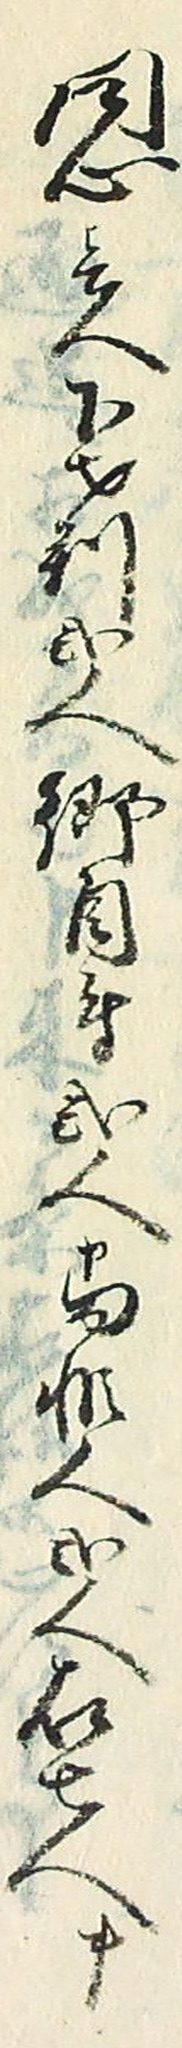同心壱人下才判弐人郷目付弐人番非人弐人右七人ヲ
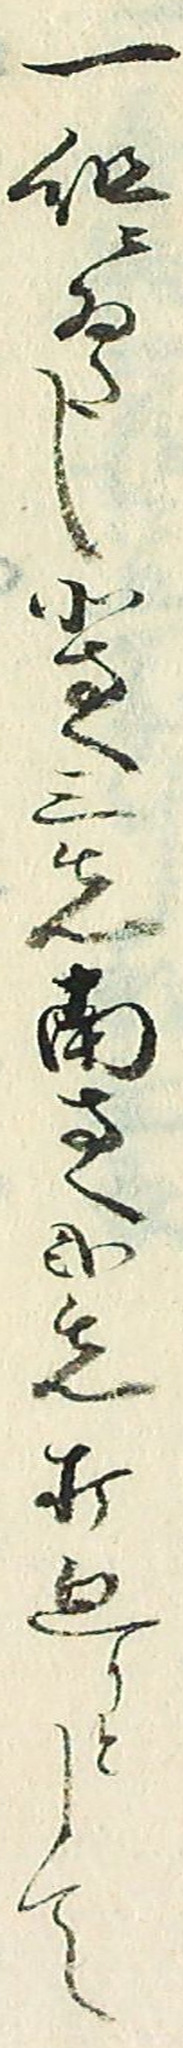一組ニゐたし北方へ三先南方へ弐先打廻りとして
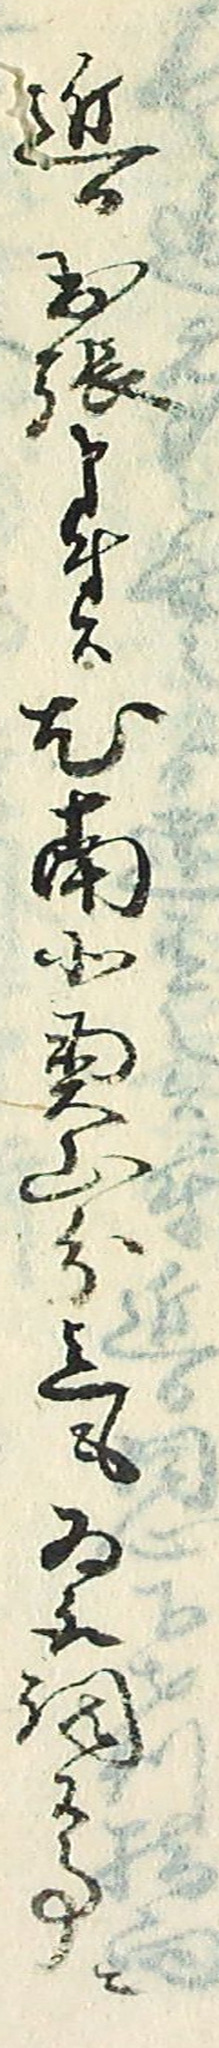近日出張申付候尤南北奥山分迄も為取調候事ニ
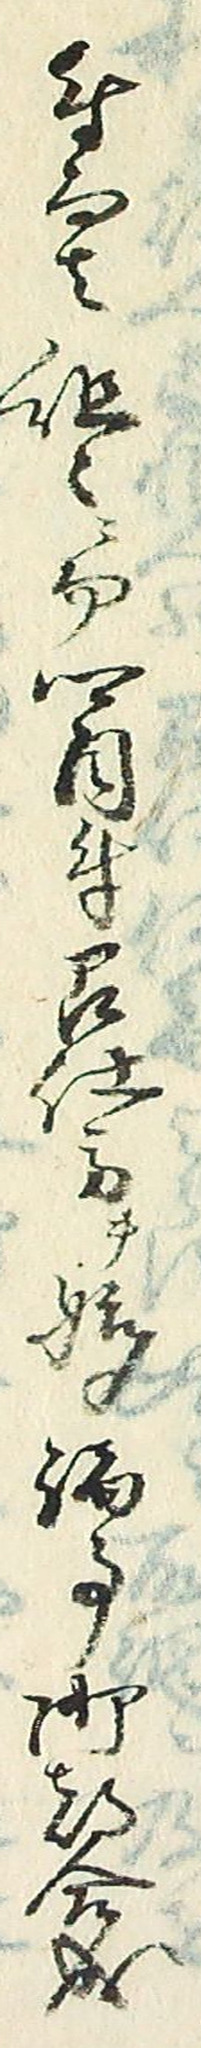付而者組々ニ而郷目付召仕方ヲ始メ諸事御都合成
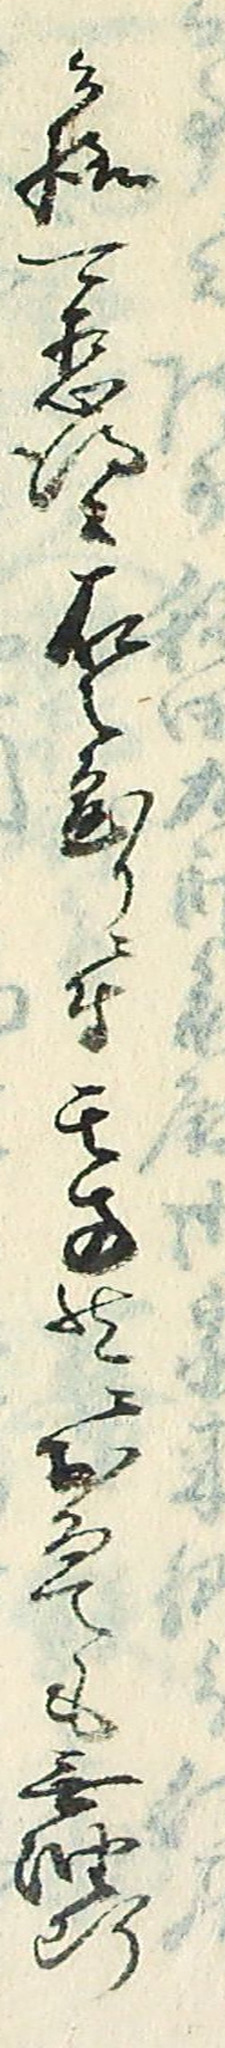候様可相心得候右之懸りニ付其方共ニおゐても無油断
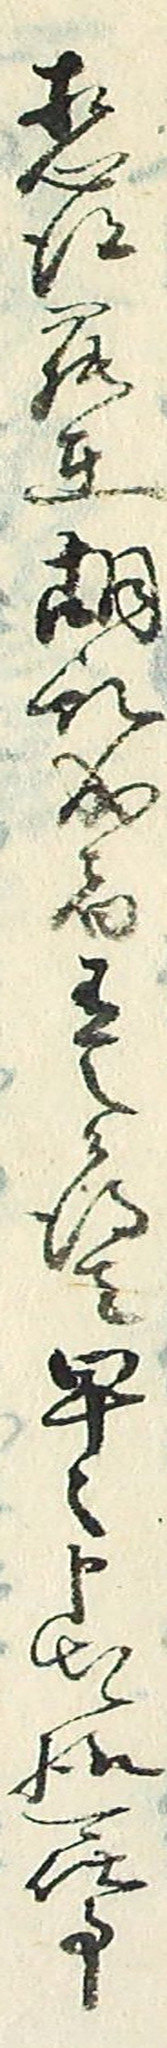相心得罷在胡乱成者有之候得者早々申出候様可仕事
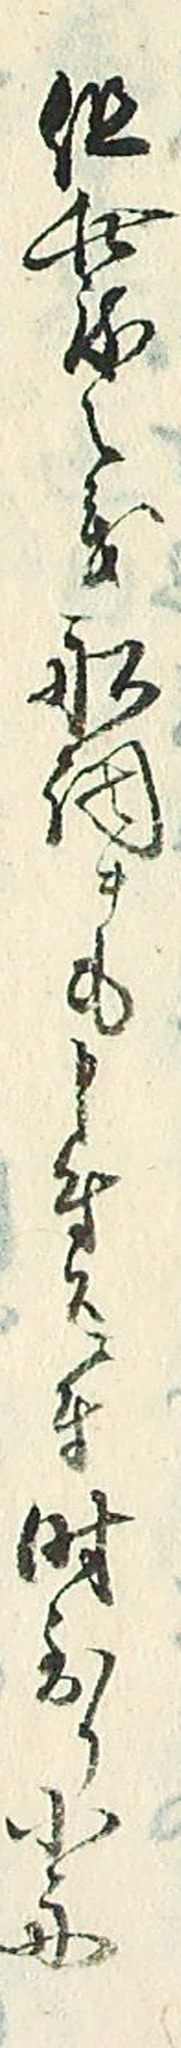但此度之義舩調ヲも申付候ニ付時至り小舟
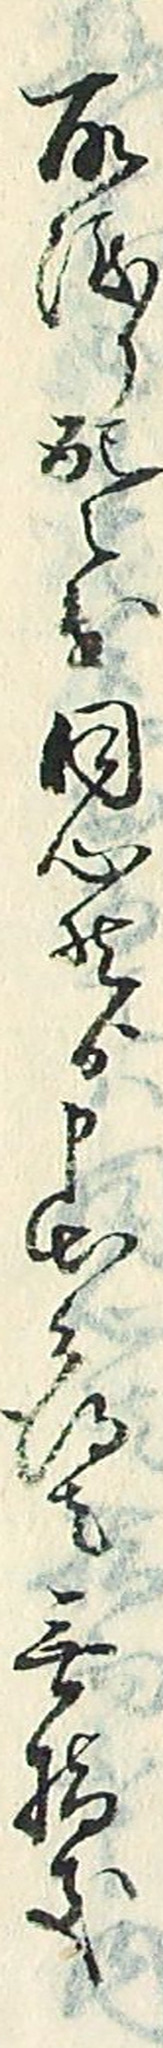取渡り配之義同心共ゟ申出候得者無指支
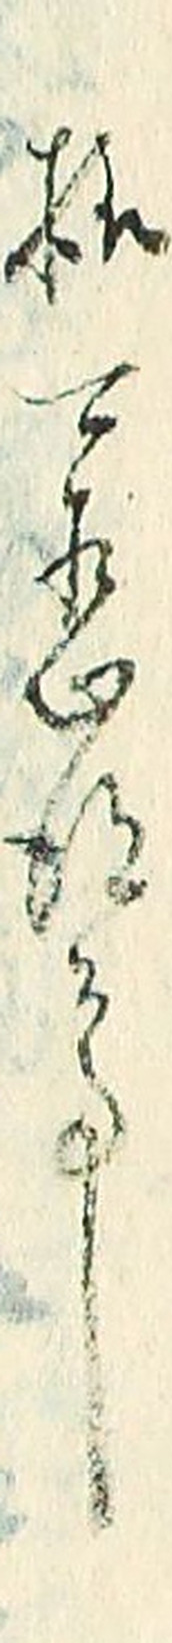様可相心得候事

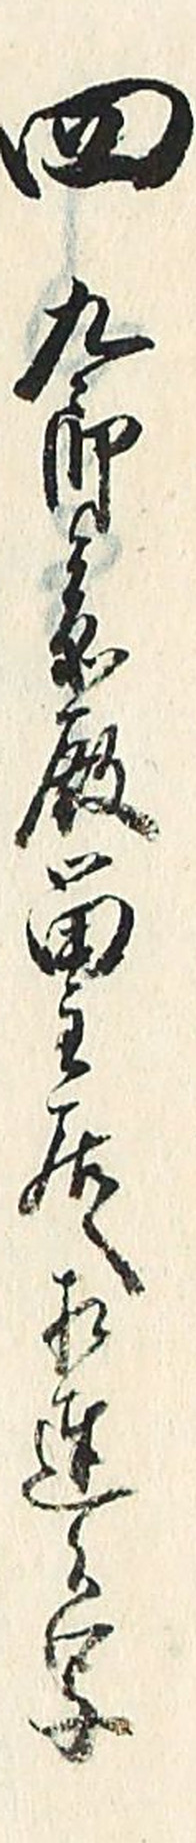四九郎兵衛殿留主居へ相達候写
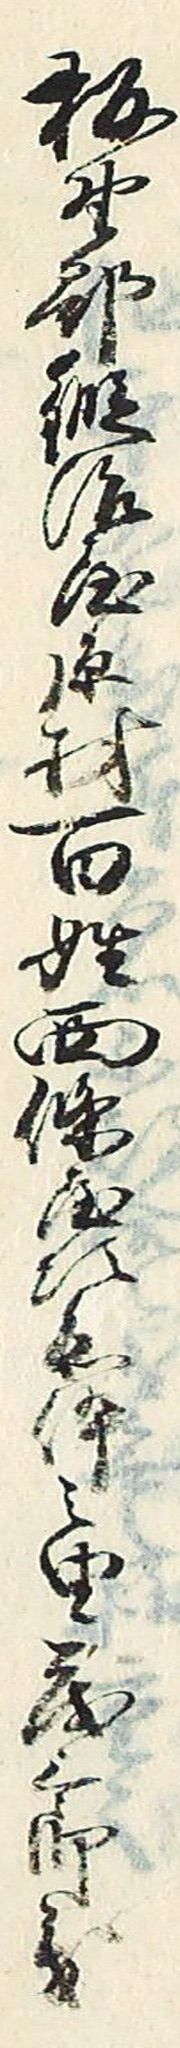板野郡鍛冶屋原村百姓西條屋次兵衛伜之由茂三郎義
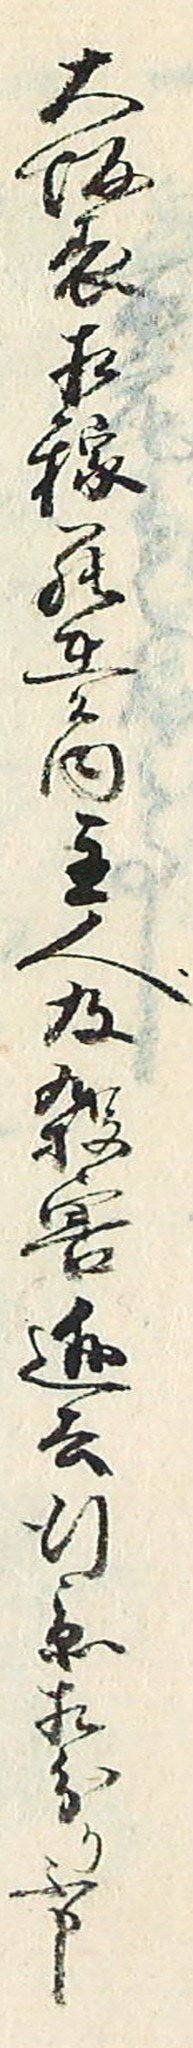大坂表相稼罷在候内主人及殺害迯去行衛相分り不申
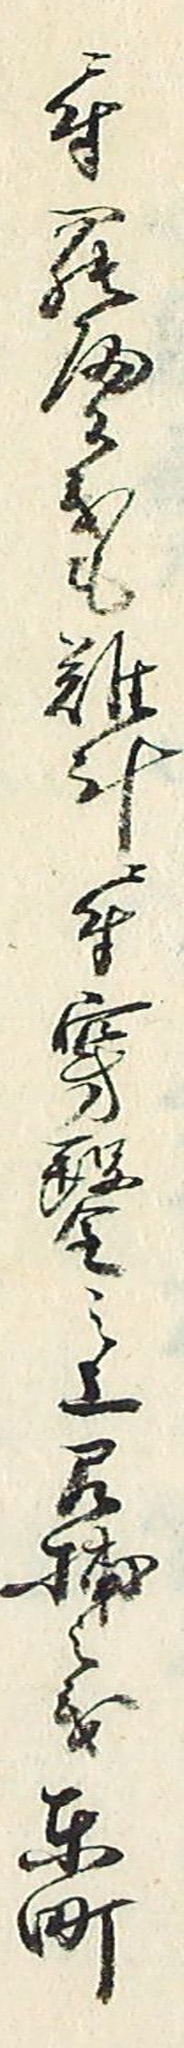ニ付罷帰候義も難計ニ付穿鑿之上召捕之義東町
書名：諸御趣意書并御下知向之写
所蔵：鳴門教育大学 Naruto University of Education
